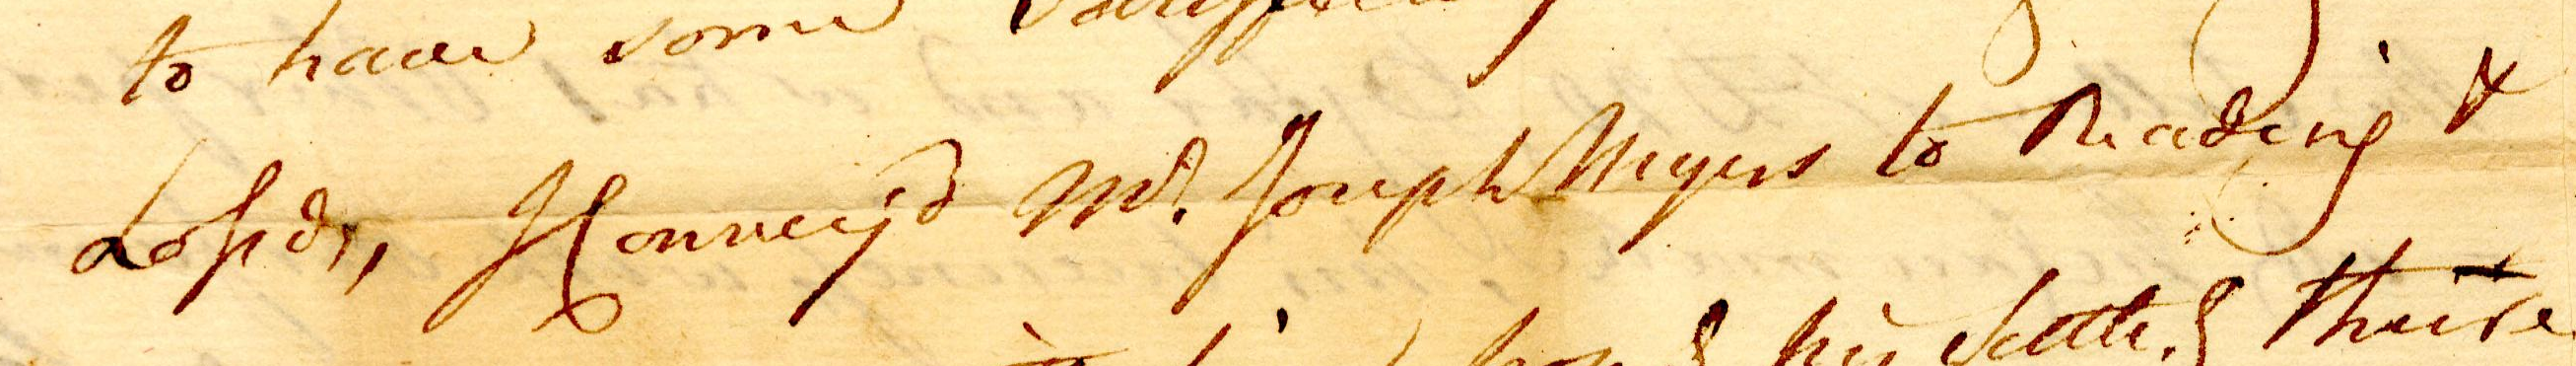Losses, Honney'd M^r. Joseph Myers to Reading &
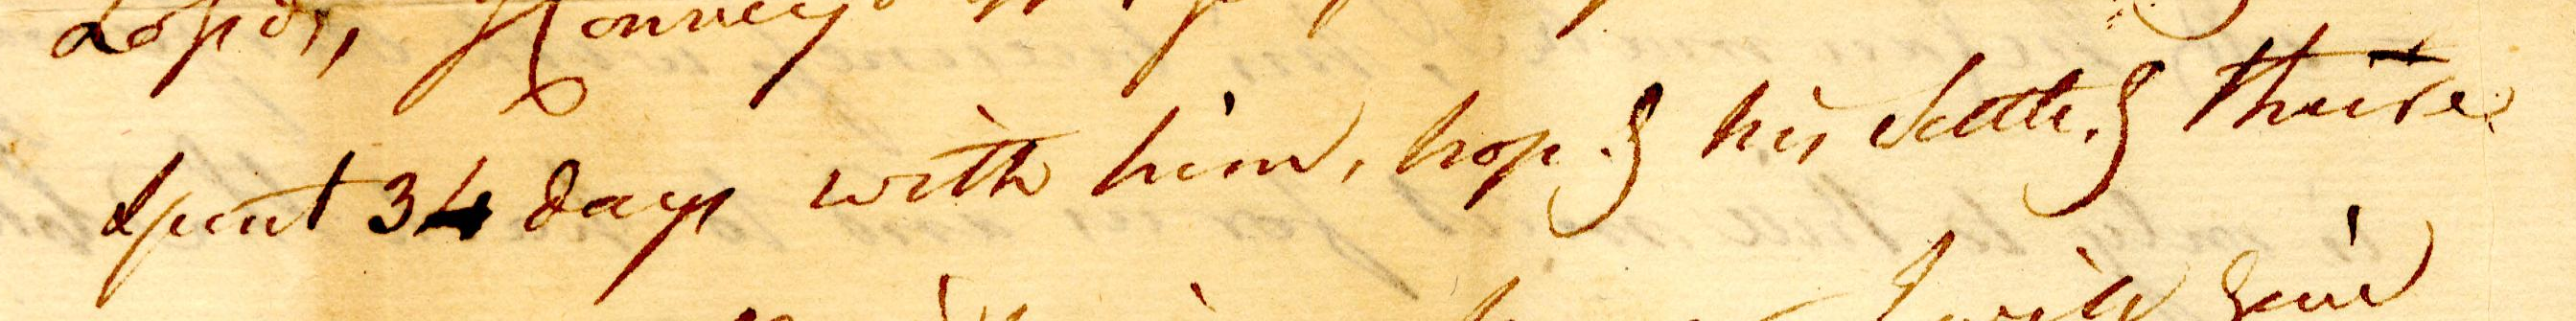Spent 34 days with him, hop.^g his settle^g theire
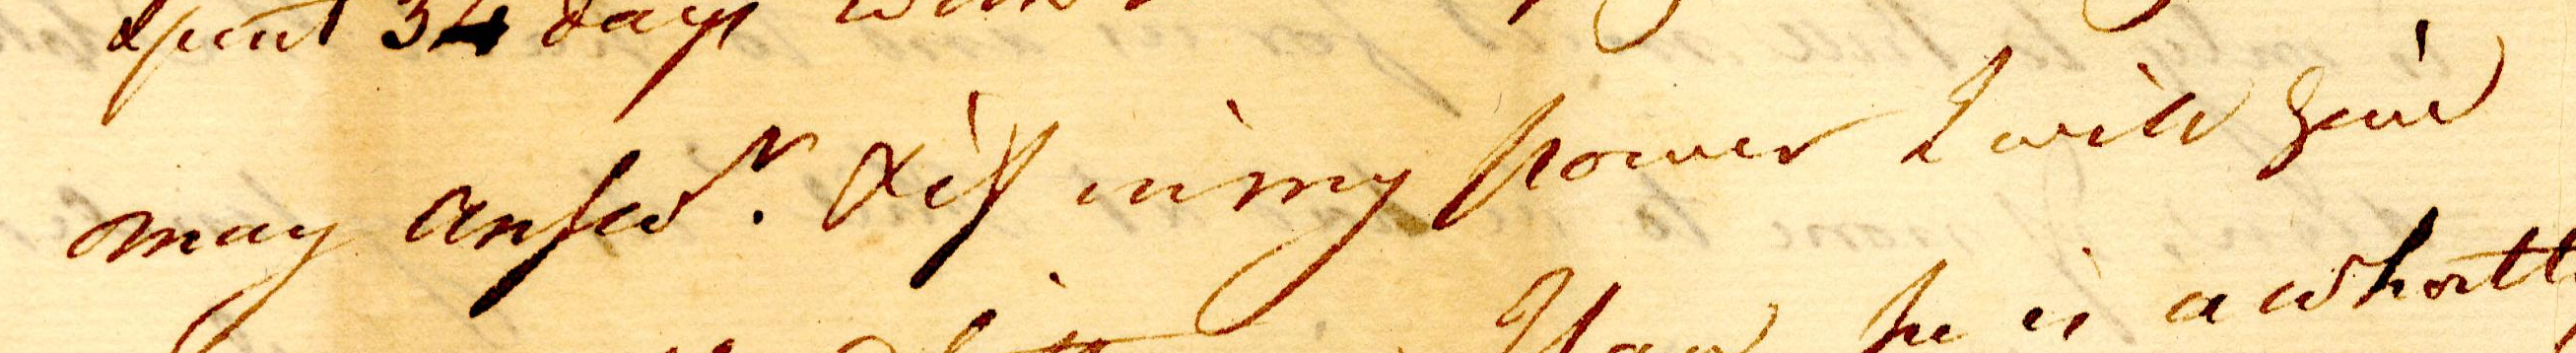may answ^r. & if in my power I will give
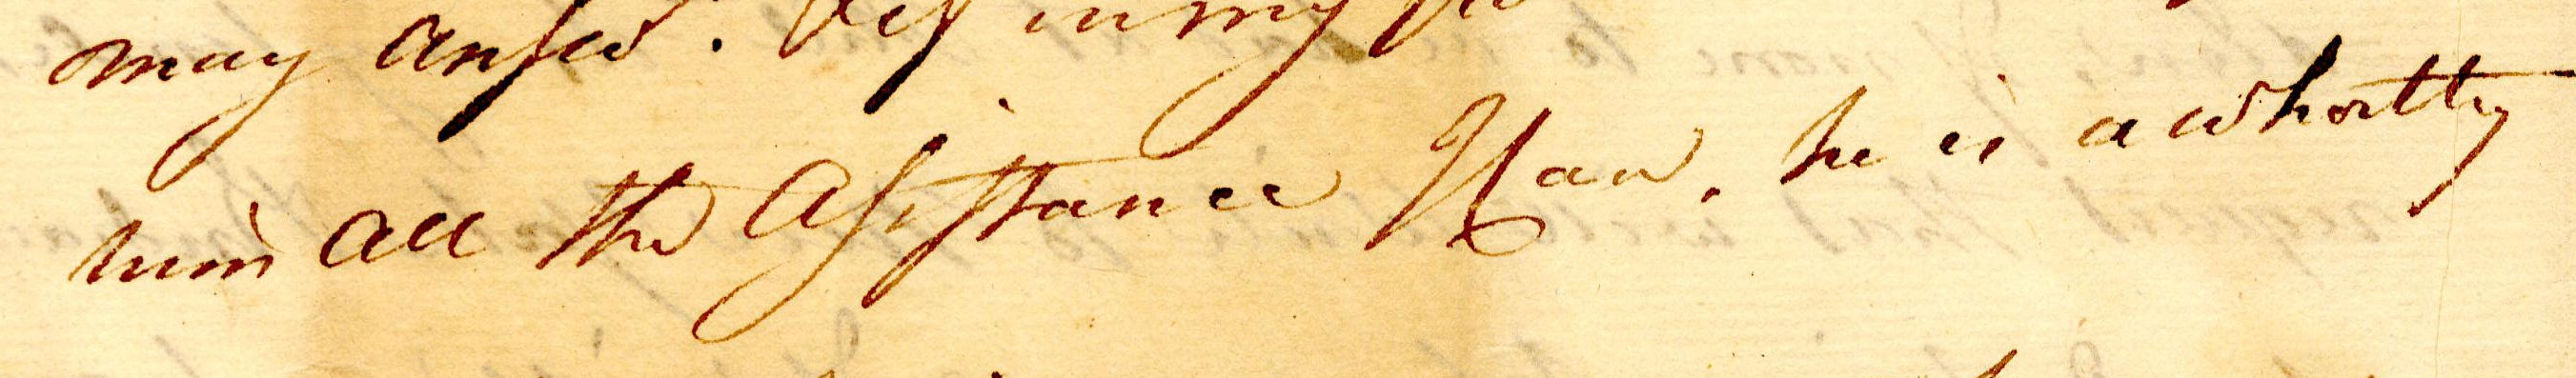him all the Asistance Now. he is a whortty
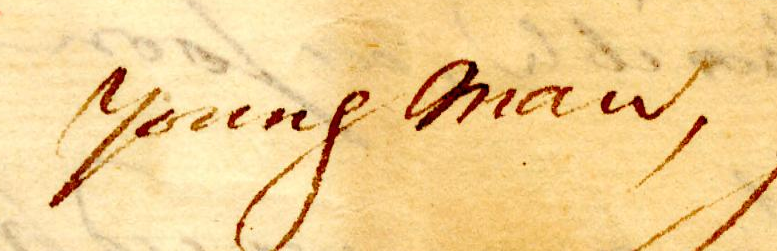young man,
